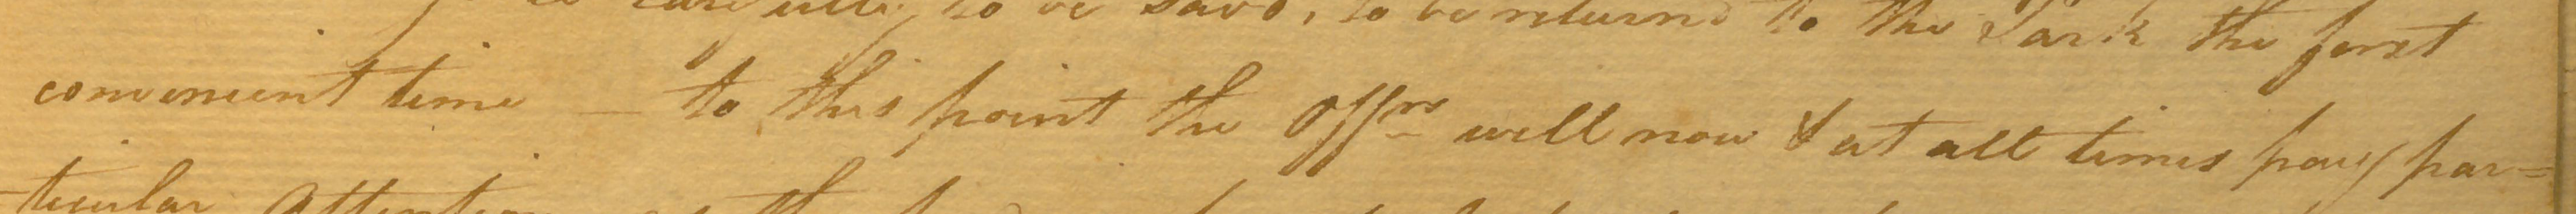convenient time- to this point the Off^rs will now & at all times pay par-
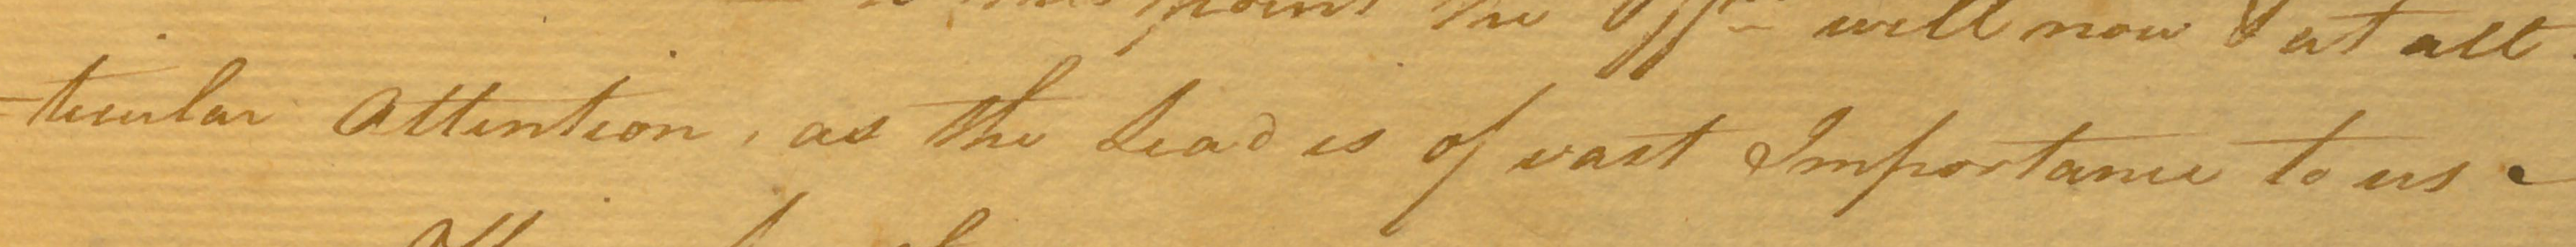-ticular Attention, as the Lead if of vast Importance to us.
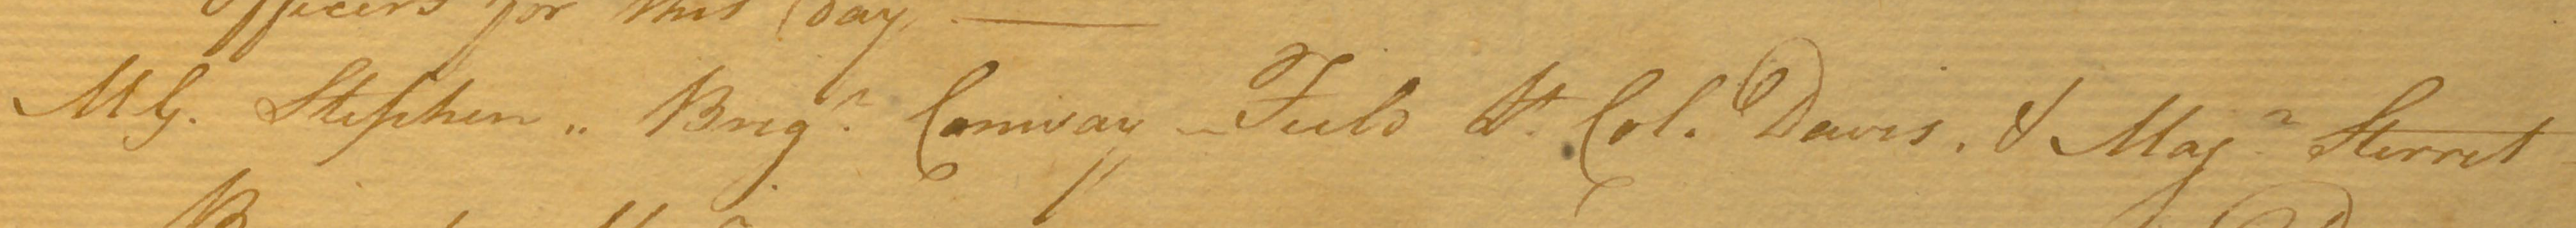MG. Stephen. Brig^r. Camisay- Field L^t. Col. Davis, & Maj^r. Sterret
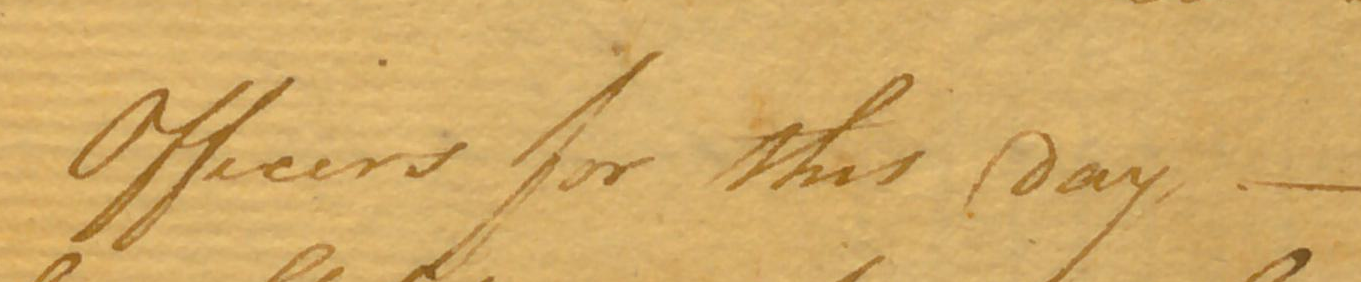Officers for this day.-
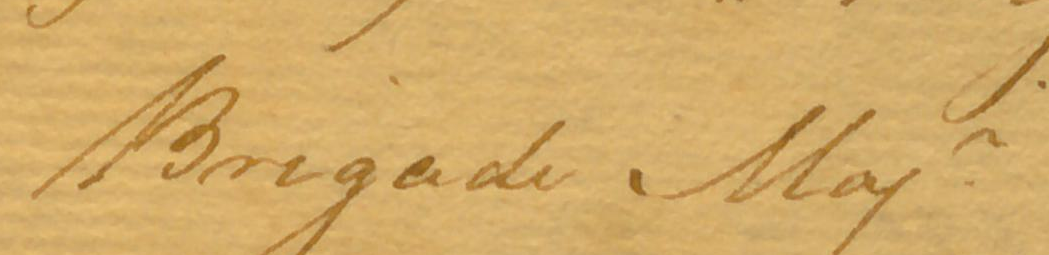Brigade Maj^r.
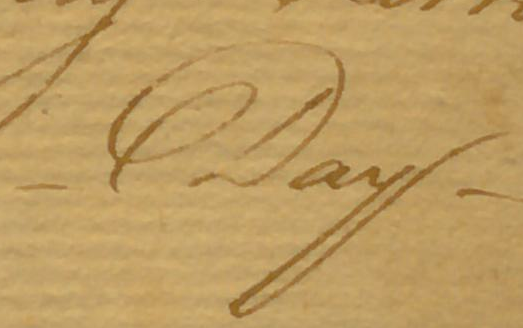Day
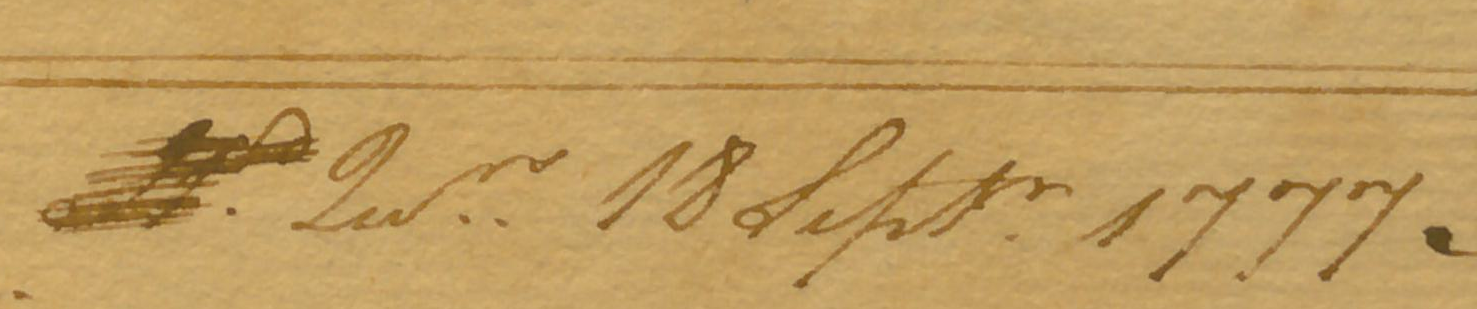[H^d.] Qu^rs. 18 Sept^r. 1777
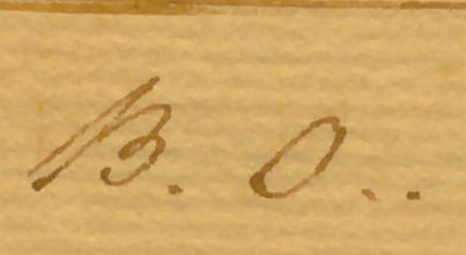B.O..
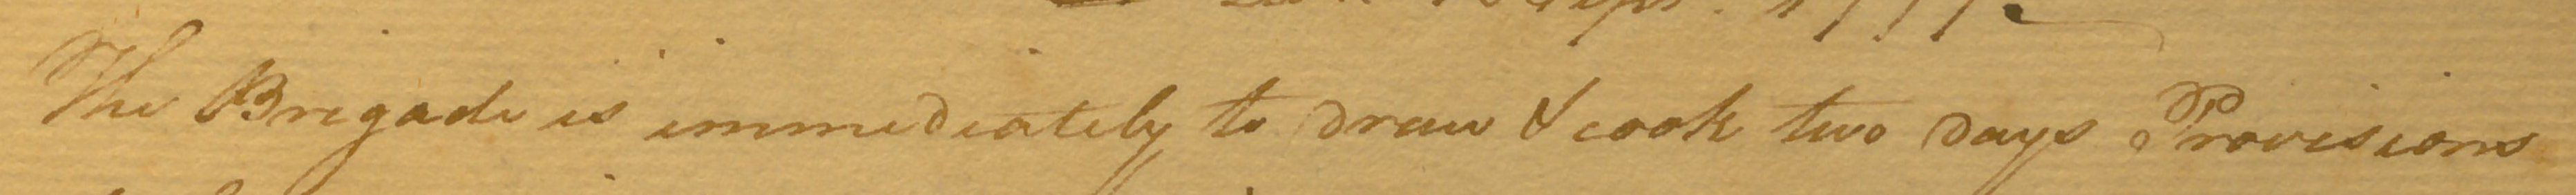The Brigade is immediately to draw & cook two days Provisions
